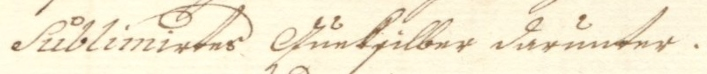Sublimirtes Zueksilber darunter.
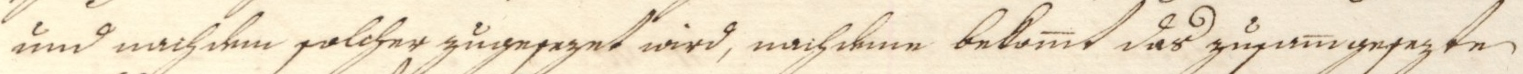und nachdem solcher zugesezet wird, nachdeme bekommt das zusammgesezte
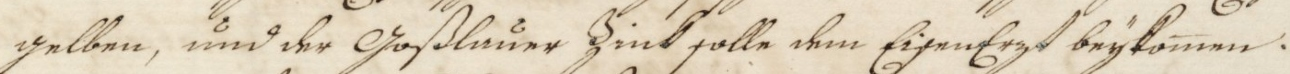gelben, und der Goßlauer Zink solle dem EigenErzt beykommen.
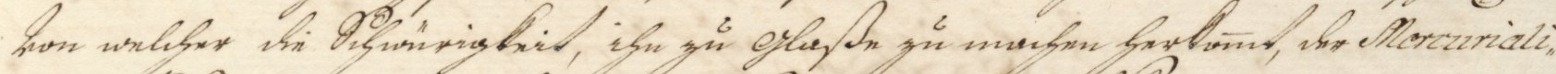von welcher die Schwürigkeit, ihn zu Glaße zu machen herkommt, der Mercuriali-
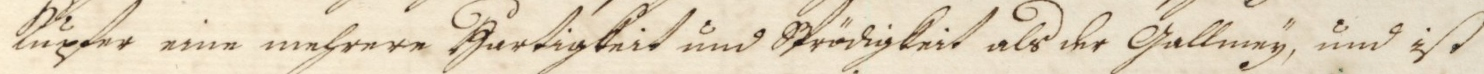Kupfer eine mehrere Hartigkeit und Sprödigkeit als der Gallmey, und ist
